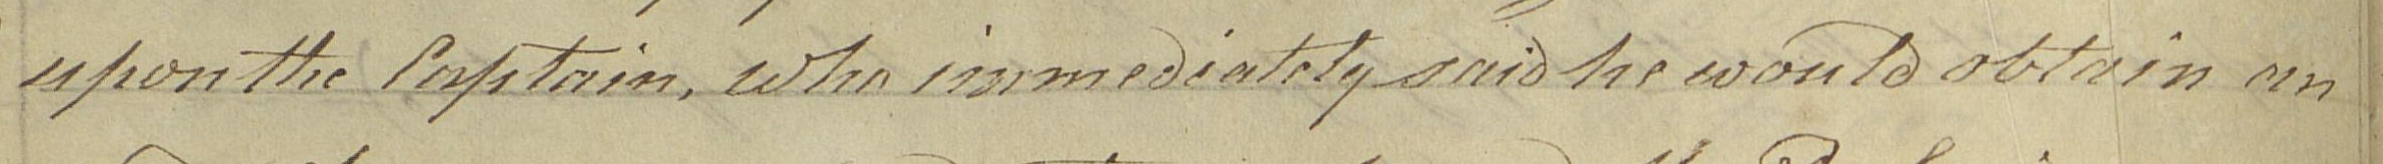upon the Captain, who immediatety said he would obtain an
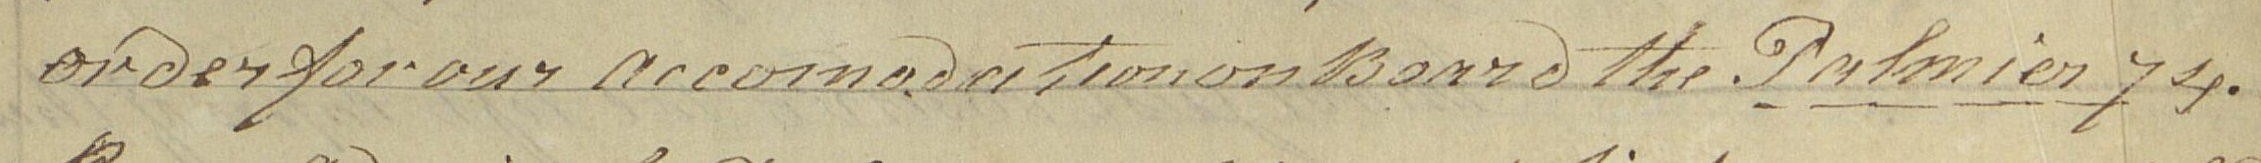order for our accomodation on Board the Palmier 74.
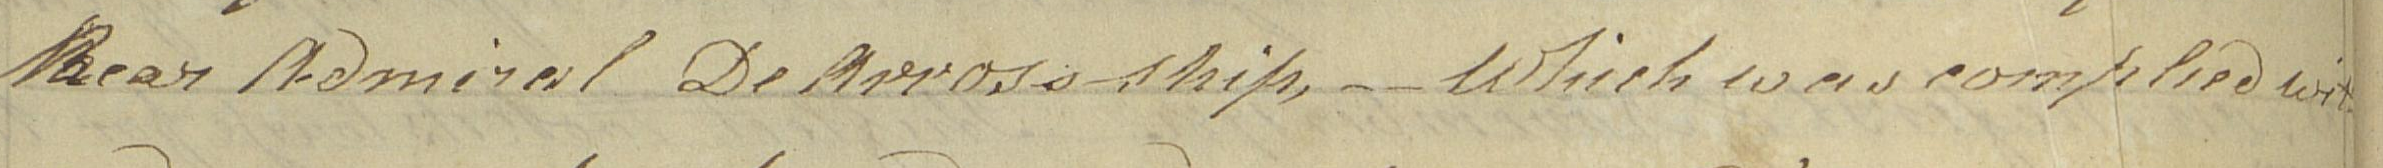Rear Admiral De Arross Ship, Which was complied with
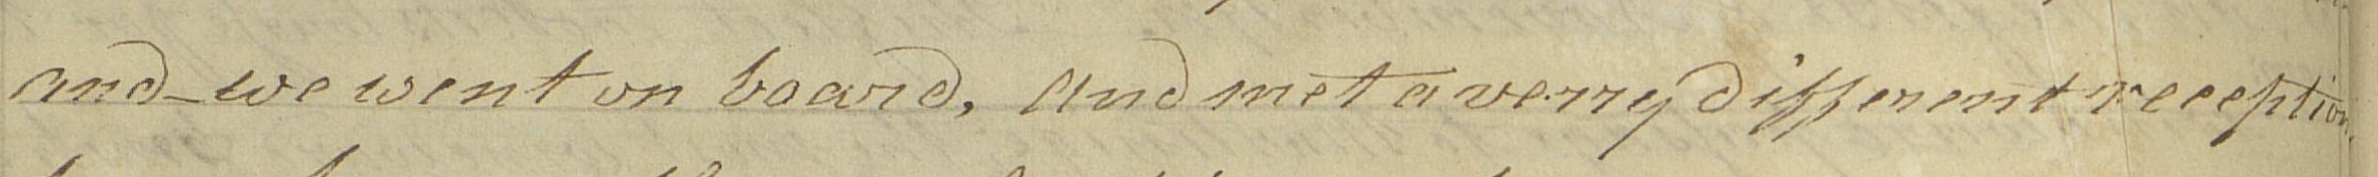and we went on board, And met a verry different reception
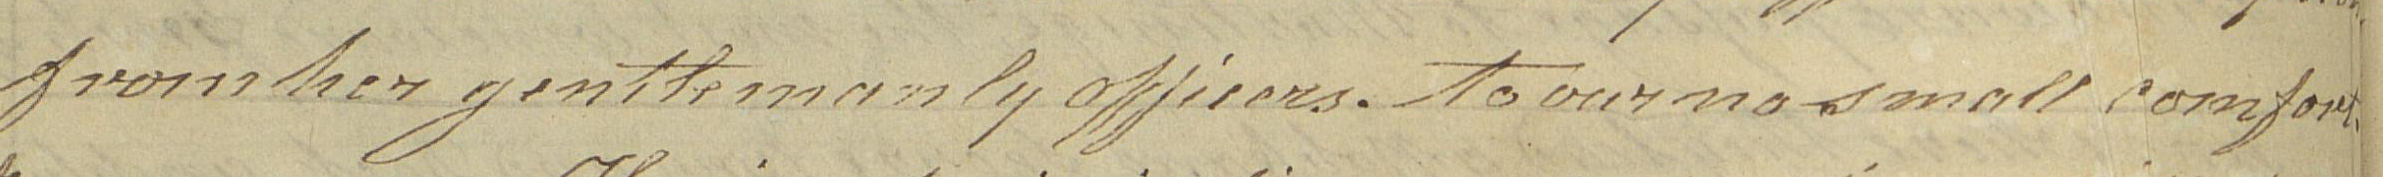from her gentlemanly officers. to our no small comfort
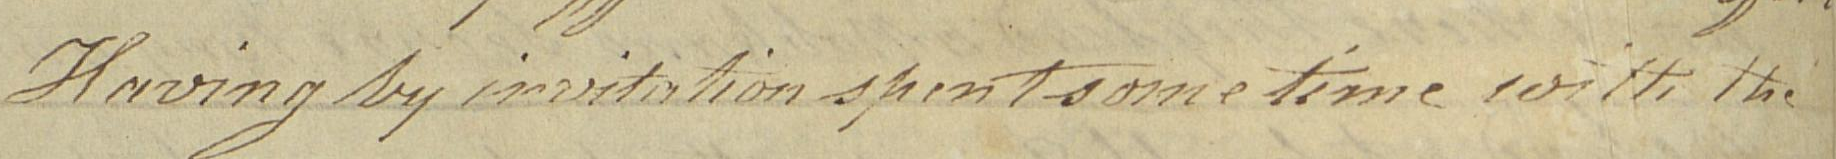Having by invitation spent some time with the
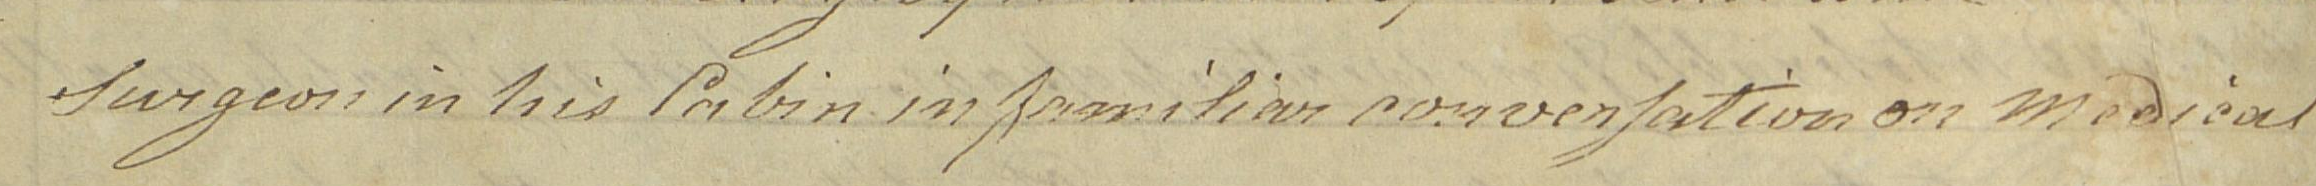surgeon in his Cabin in familiar conversation on Medical
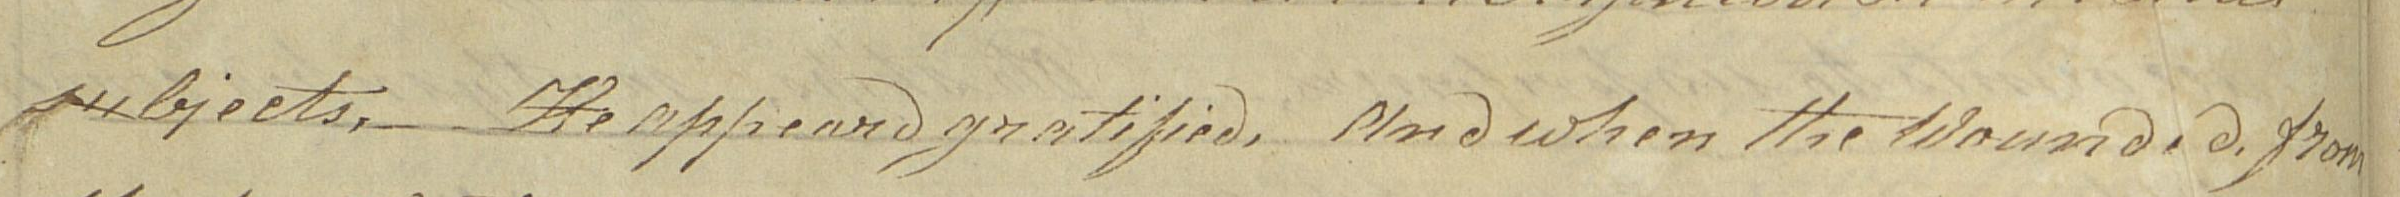subjects. He appeard gratified, And when the Wounded from
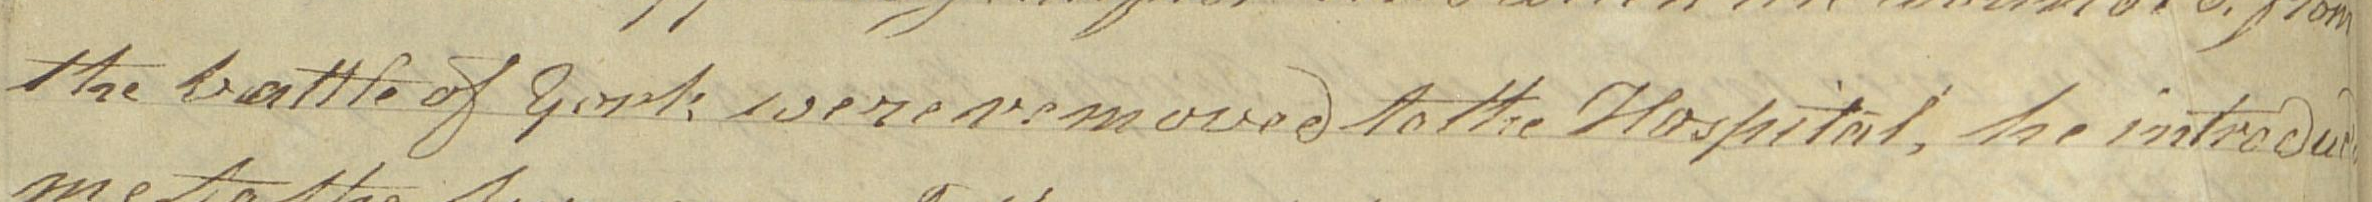the battle of York were removed to the Hospital, he introdu-
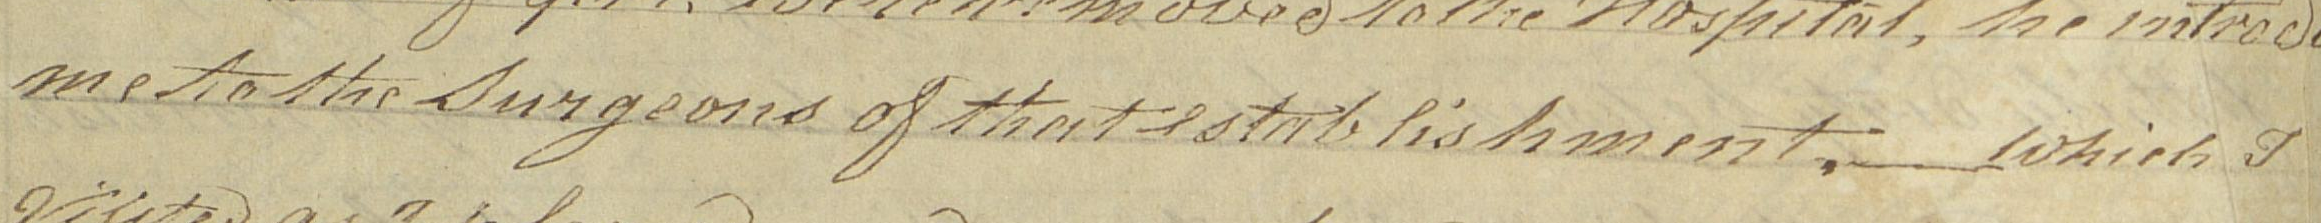me to the Surgeons of that establishment, which I
